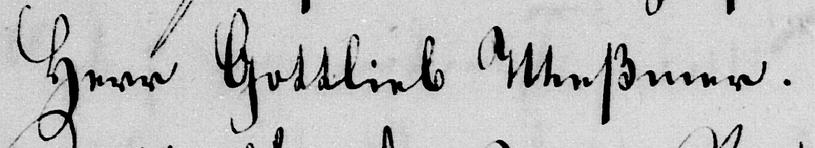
Herr Gottlieb Meßmer.
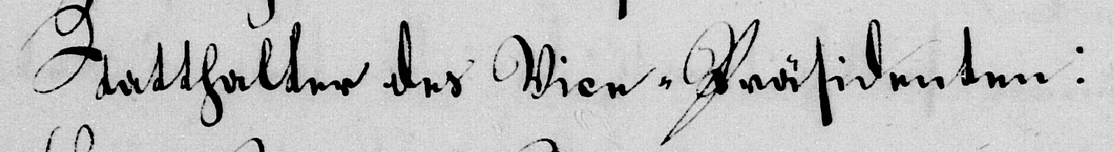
Statthalter des Vice-Präsidenten:
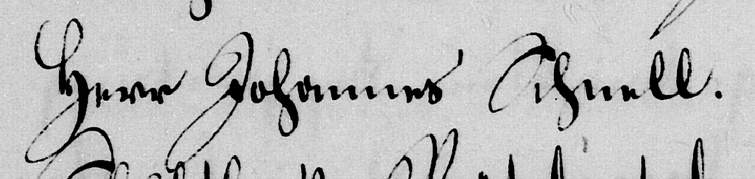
Herr Johannes Schnell.
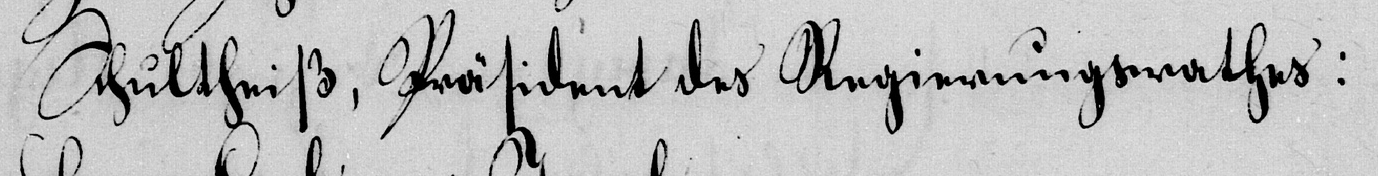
Schultheß, Präsident des Regierungsrathes:
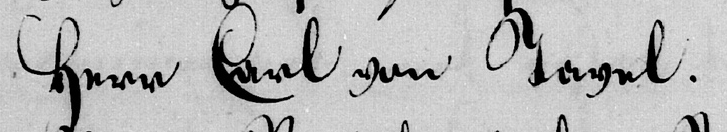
Herr Carl von Tavel.
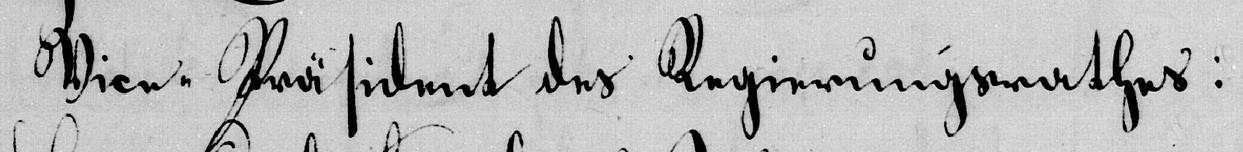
Vice-Präsident des Regierungsrathes:
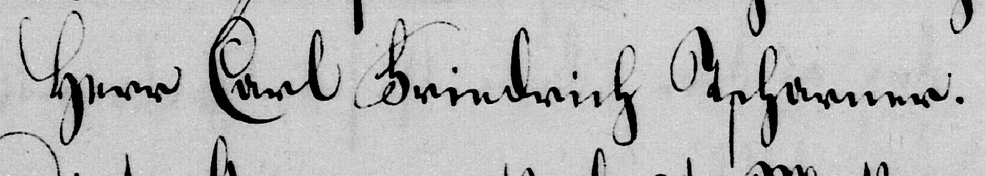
Herr Carl Friedrich Tscharner.
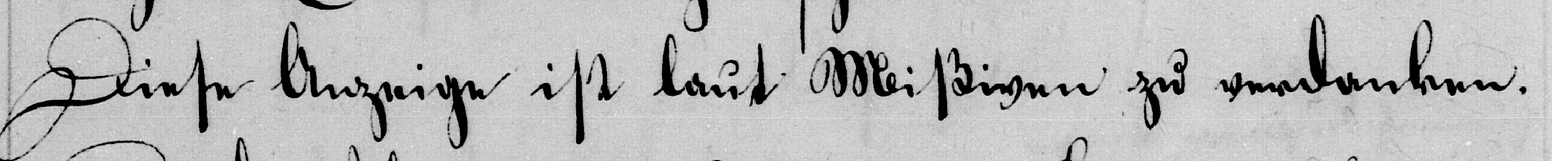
Diese Anzeige ist laut Mißiven zu verdanken.
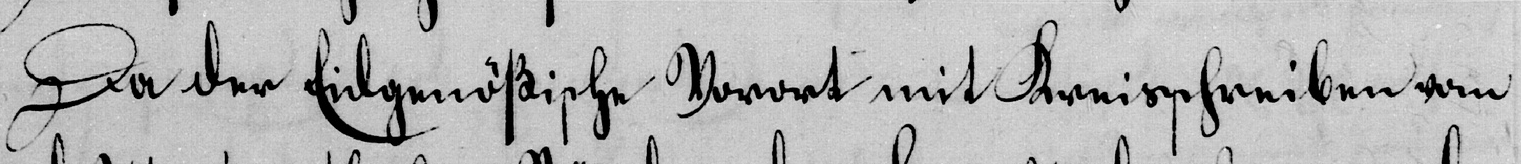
Da der Eidgenößische Vorort mit Kreisschreiben vom
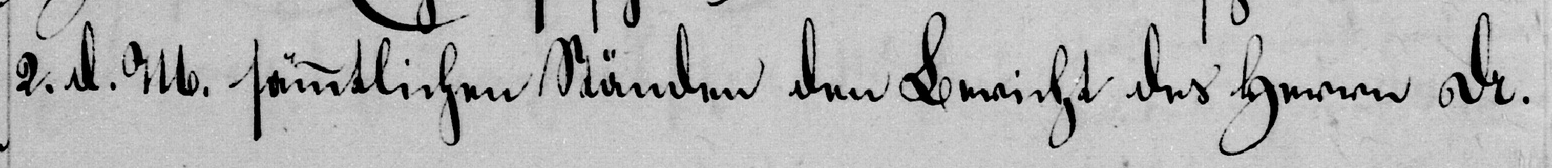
2. d. M. sämmtlichen Ständen den Bericht des Herrn Dr.
